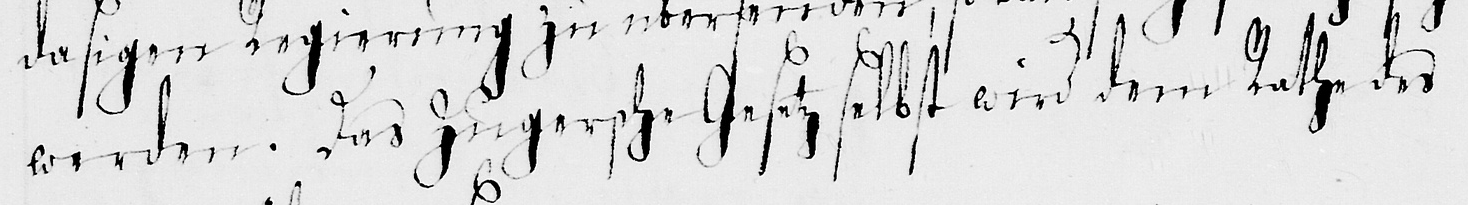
werden. Das Zugersche Gesetz selbst wird dem Rathe des
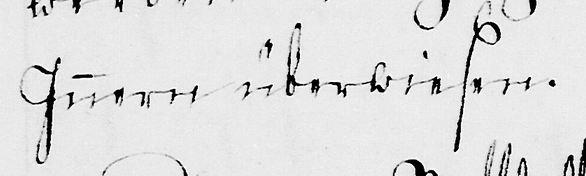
Innern überwiesen.
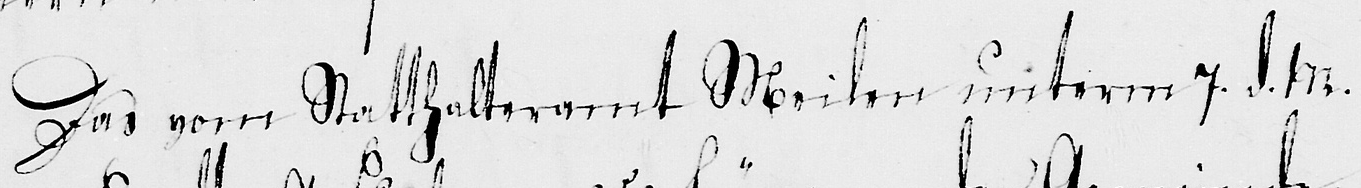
Das vom Statthalteramt Meilen unterm 7. d. M.
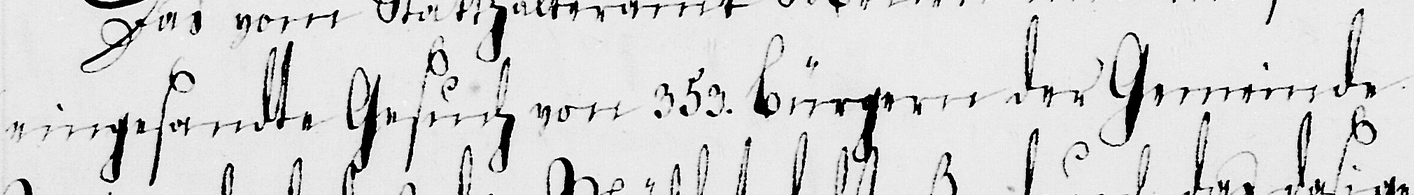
eingesandte Gesuch von 353. Bürgern der Gemeinde
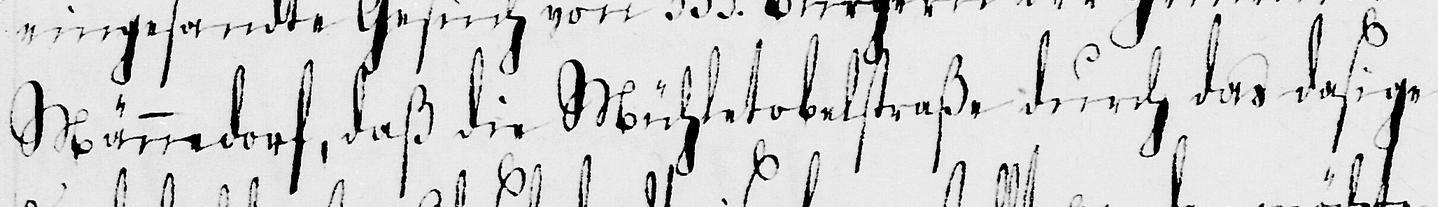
Männedorf, daß die Mühletobelstraße durch das dasige
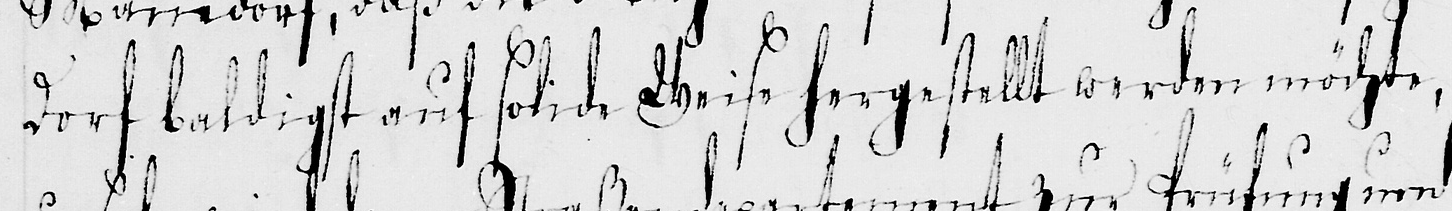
Dorf baldigst auf solide Weise hergestellt werden möchte,
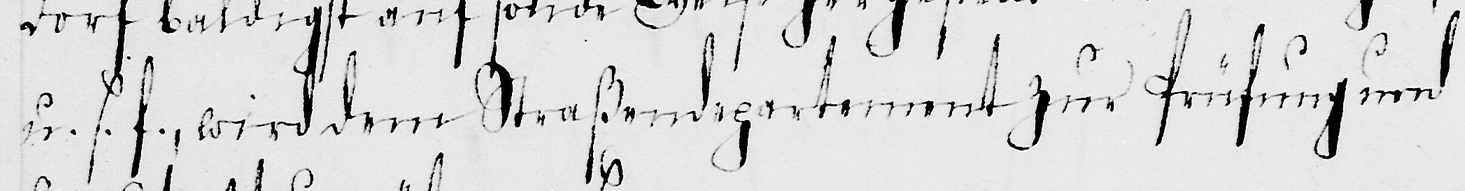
u.s.f., wird dem Straßendepartement zur Prüfung und
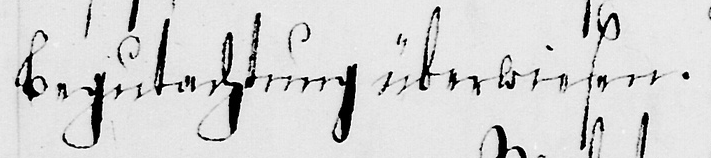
Begutachtung überwiesen.
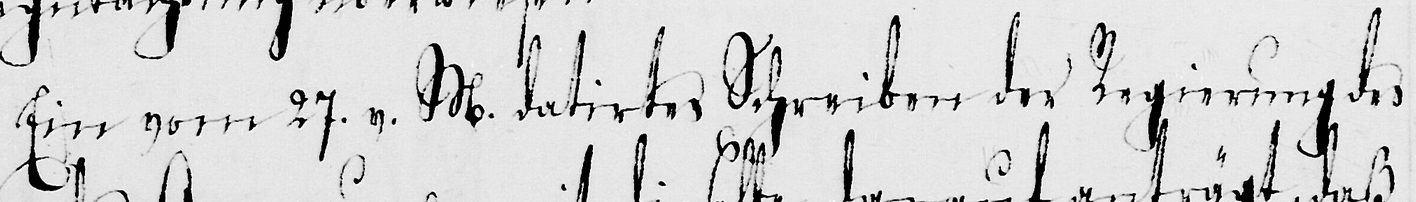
Ein vom 27. v. M. datirtes Schreiben der Regierung des
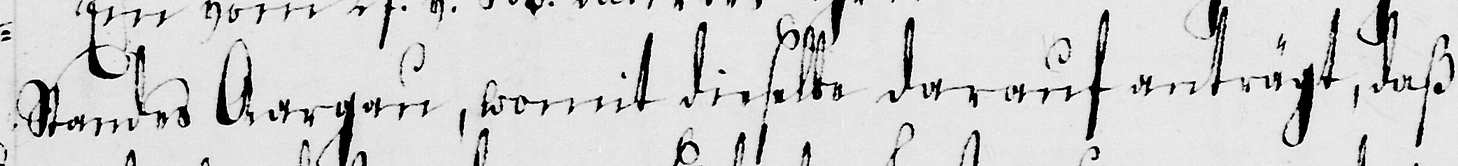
Standes Aargau, womit dieselbe darauf anträgt, daß
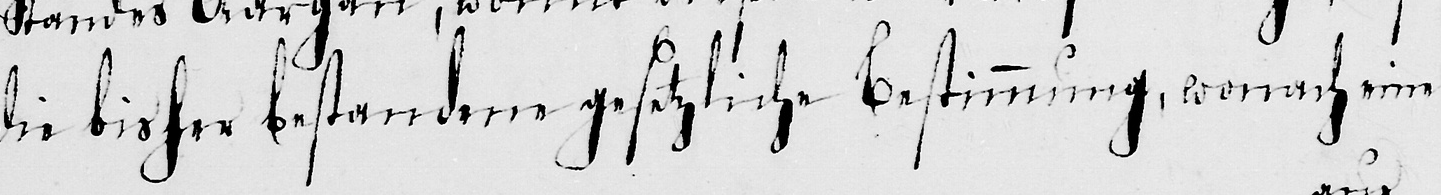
die bisher bestandene gesetzliche Bestimmung, wonach eine
